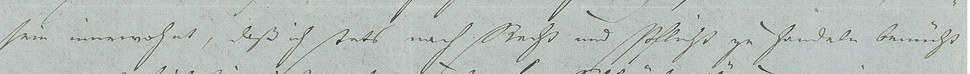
sein innewohnt, daß ich stets nach Recht und Pflicht zu handeln bemüht
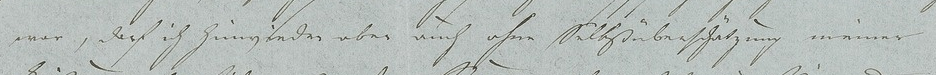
war, darf ich hinwieder aber auch ohne Selbstüberschätzung meiner
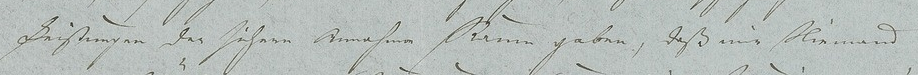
Leistungen der sichern Annahme Raum geben, daß mir Niemand,
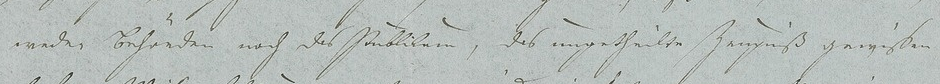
weder Behörden noch das Publikum, das ungetheilte Zeugniß gewissen-
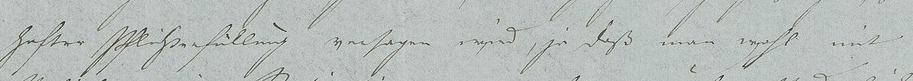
hafter Pflichterfüllung versagen wird, ja daß man wohl mit
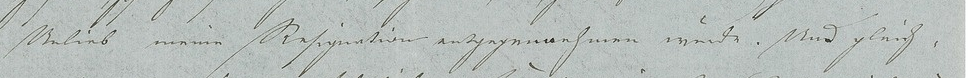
Unlieb meine Resignation entgegennehmen würde. Und gleich-
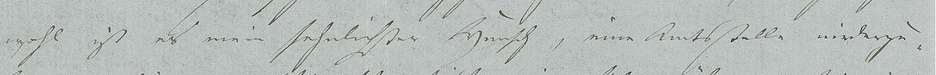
wohl ist es mein sehnlichster Wunsch, eine Amtsstelle niederzu-
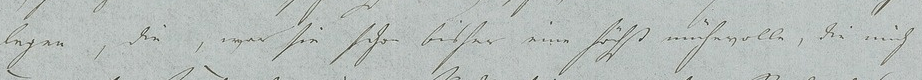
legen, die, war sie schon bisher eine höchst mühevolle, die mich
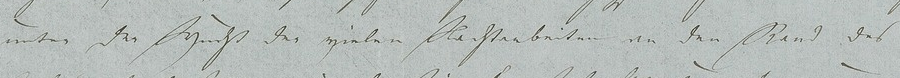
unter der Wucht der vielen Nachtarbeiten an den Rand des
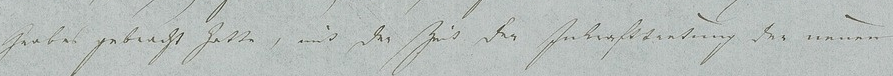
Grabes gebracht hatte, mit der Zeit der Inkrafttretung der neuen
